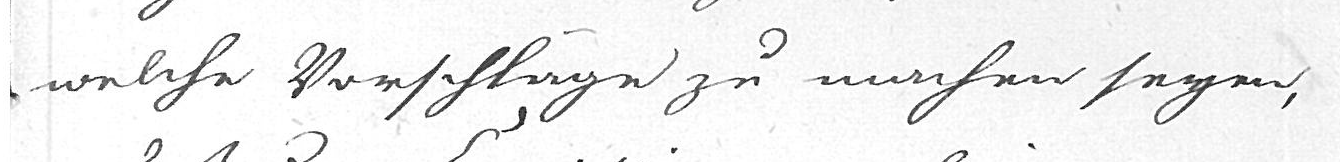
welche Vorschläge zu machen seyen,
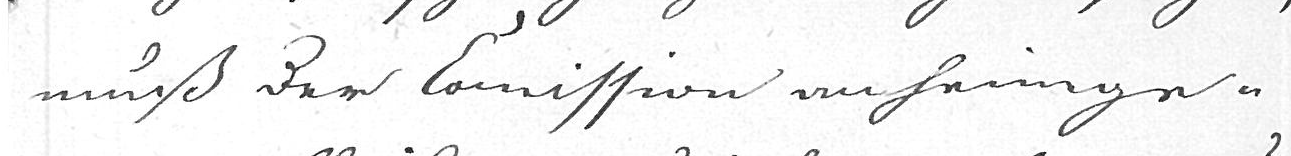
muß der Commission anheim ge-
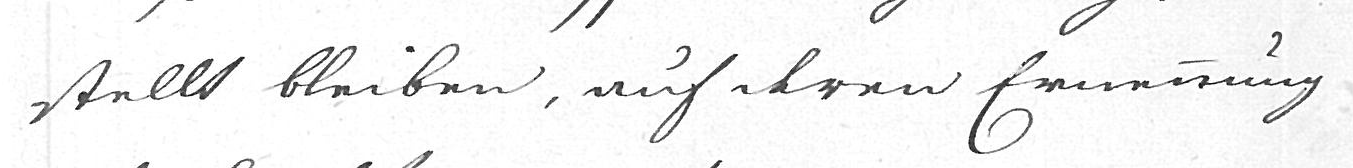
stellt bleiben, auf deren Ernennung
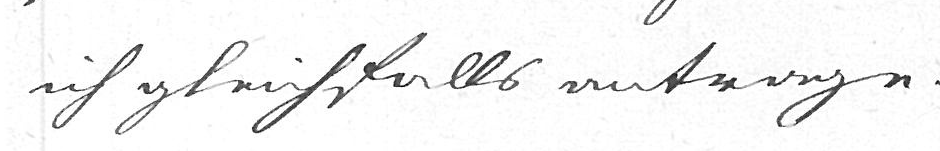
ich gleichfalls antrage.
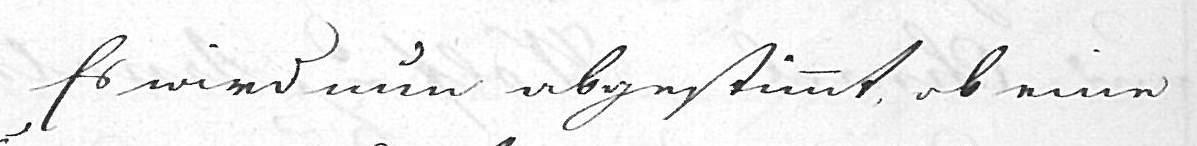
Es wird nun abgestimmt, ob eine
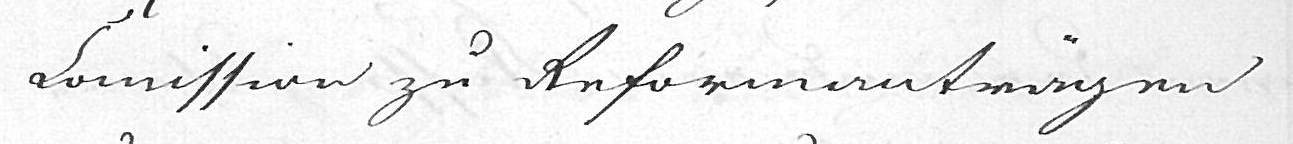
Commission zu Reformanträgen
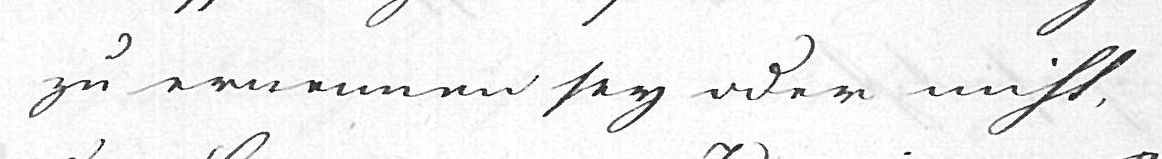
zu ernennen sey oder nicht.
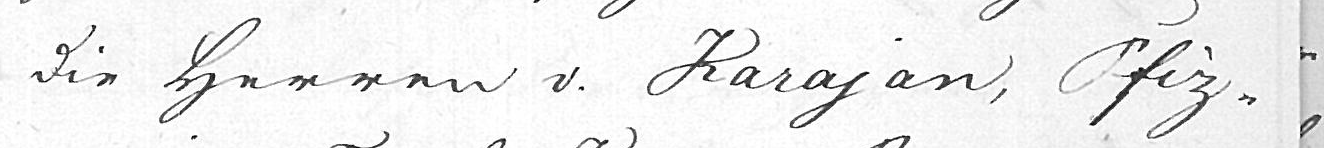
Die Herren v. Karajan, Pfiz-
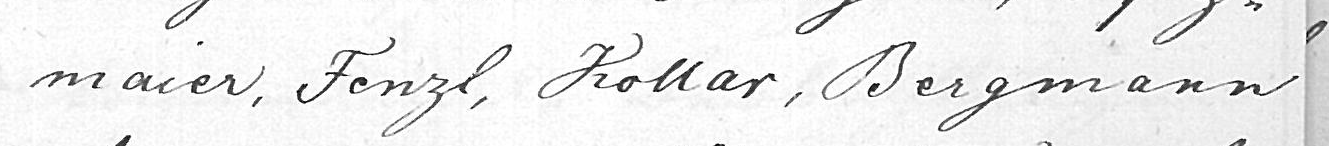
maier, Fenzl, Kollar, Bergmann,
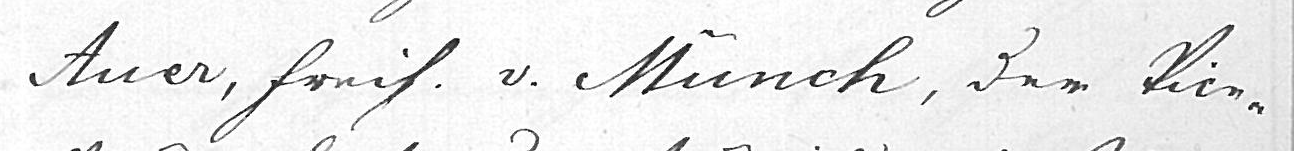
Auer, Freih. v. Münch, der Vice-
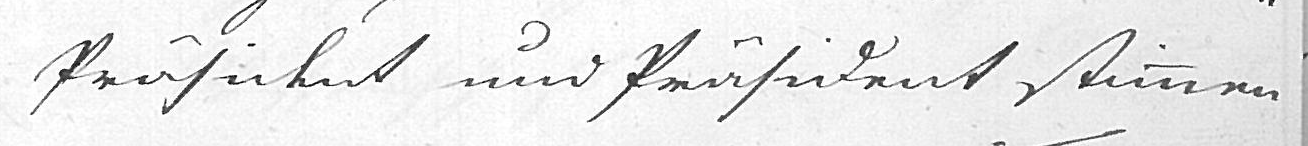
Präsident und Präsident stimmen
